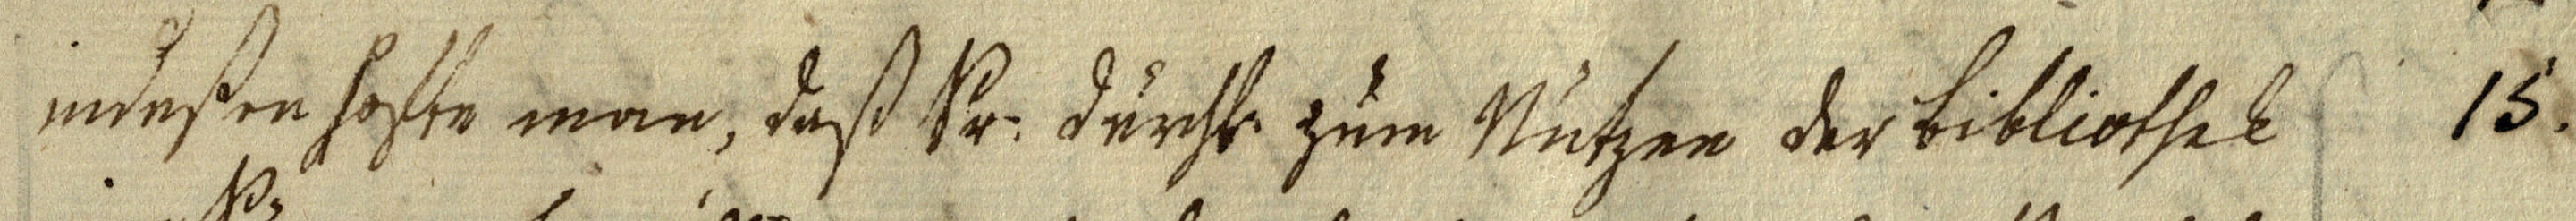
indeßen hoffe man, daß Sr. Durchl. zum Nutzen der Bibliothek
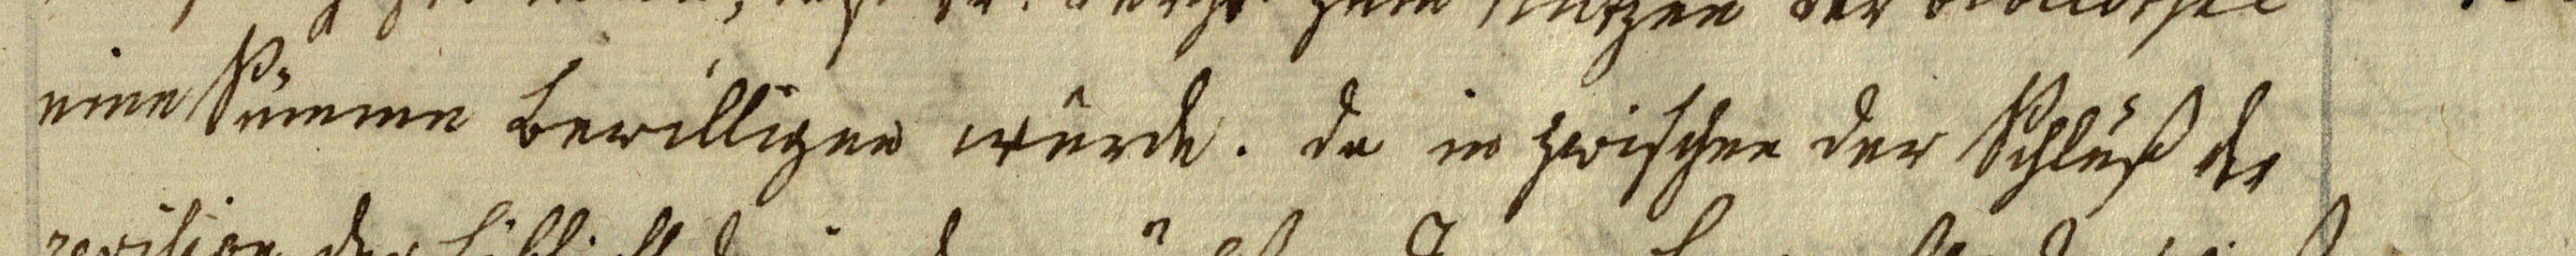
eine Summe bewilligen würde. da in zwischen der Schluß der
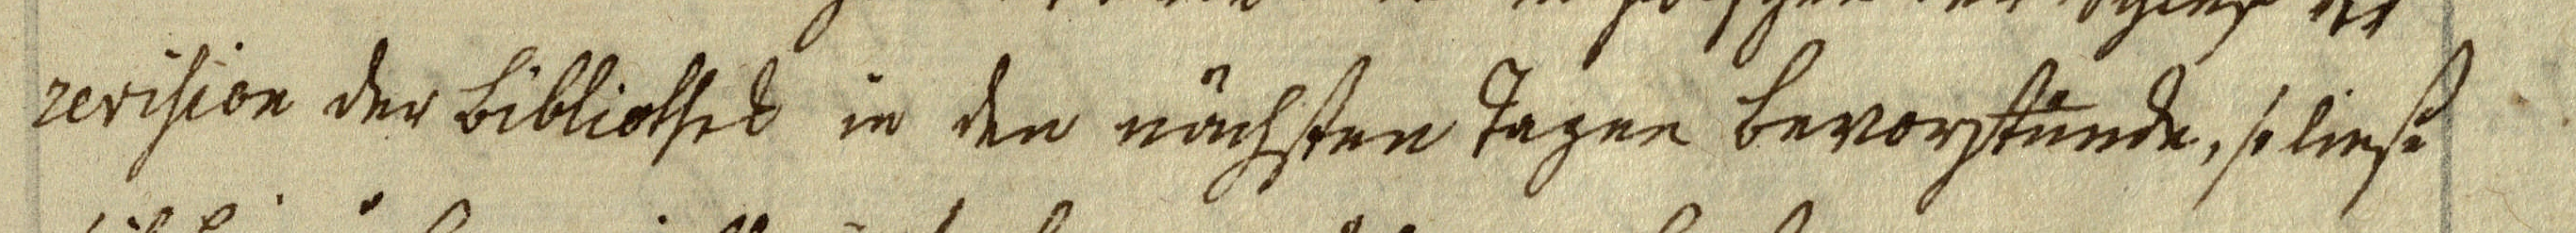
revision der Bibliothek in den nächsten Tagen bevorstünde, so ließe
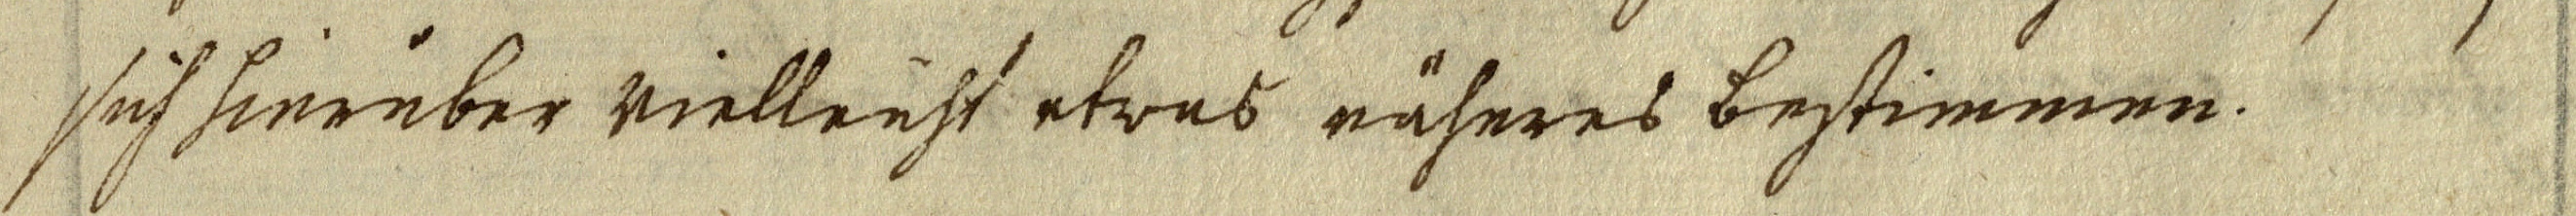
sich hierüber vielleicht etwas näheres bestimmen.
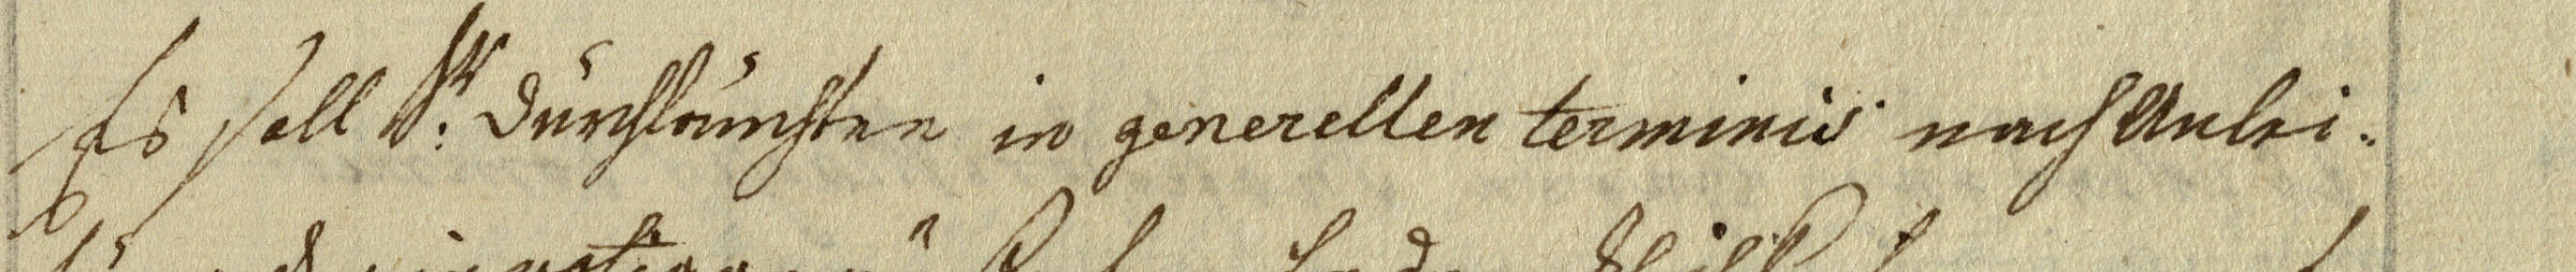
Es soll Sr Durchlauchten in generellen terminis nach Anlei¬
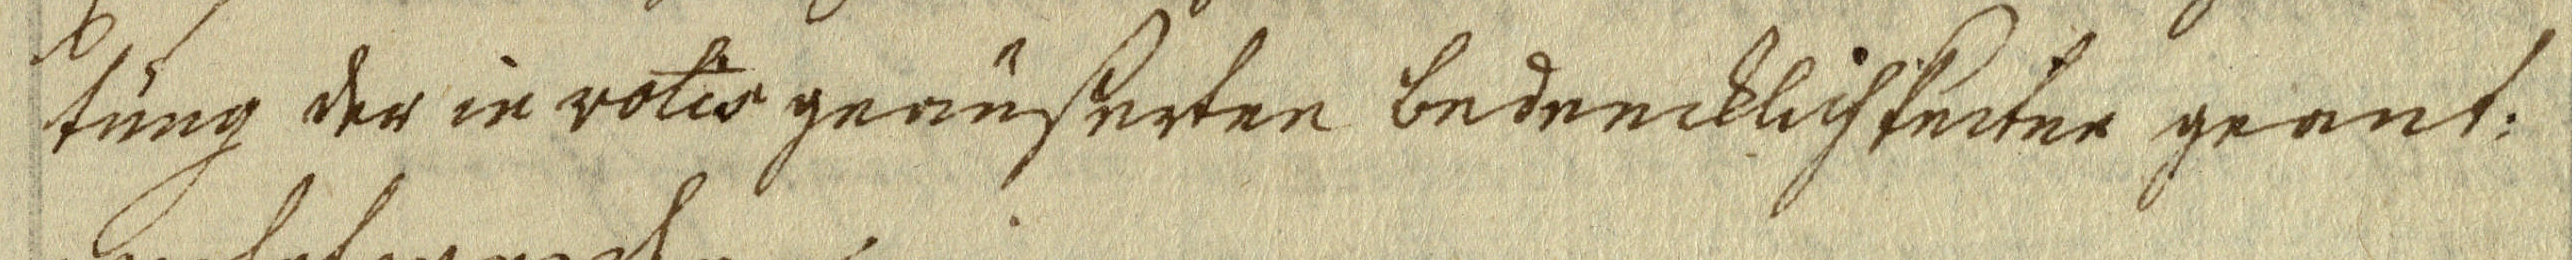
tung der in votis geäußerten Bedencklichkeiten geant¬
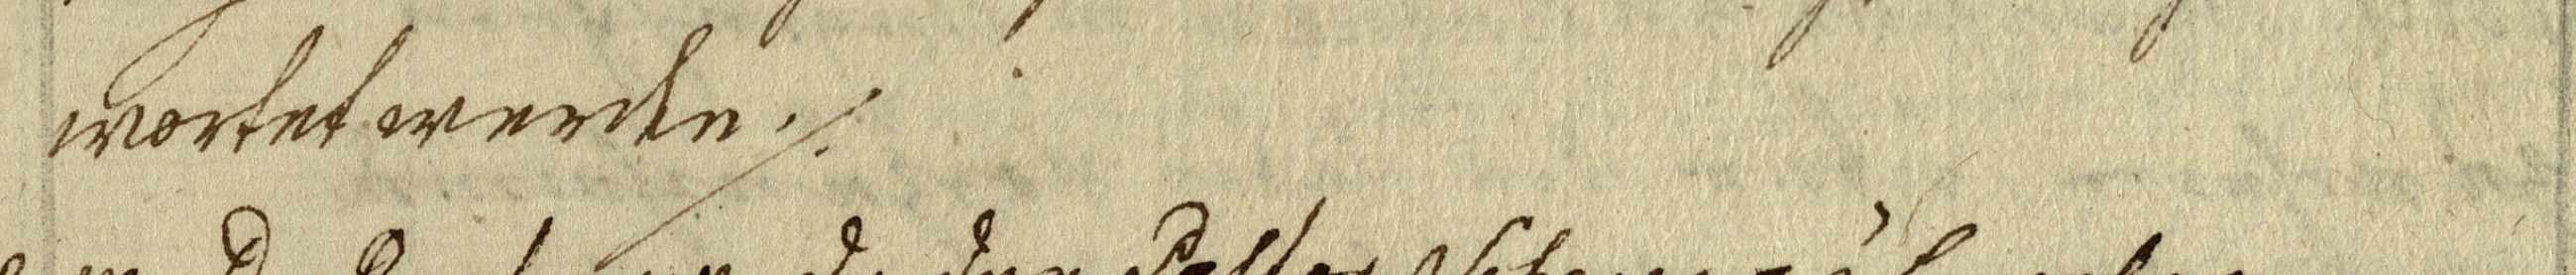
wortet werden.
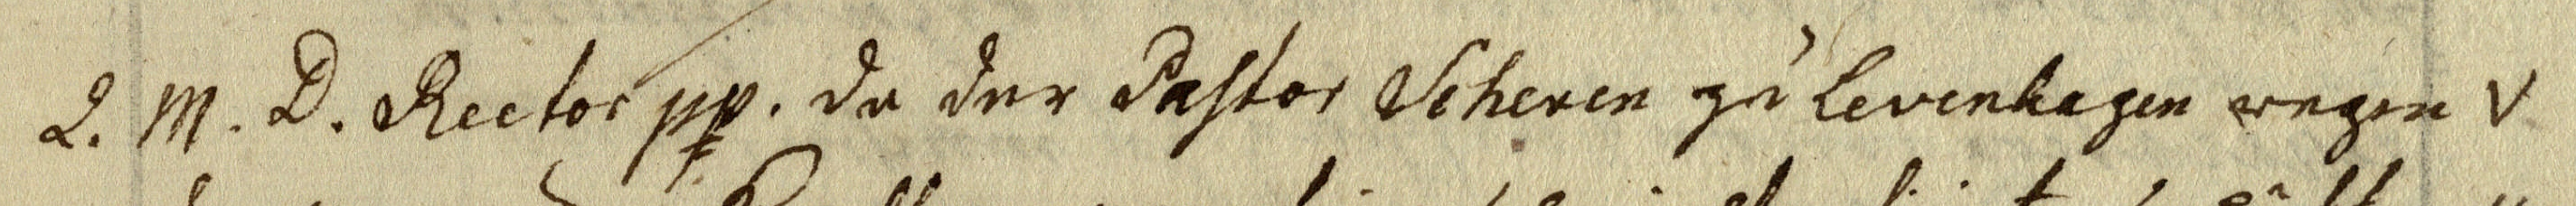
2. M. D. Rector pp. da der Pastor Scheven zu Levenhagen wegen
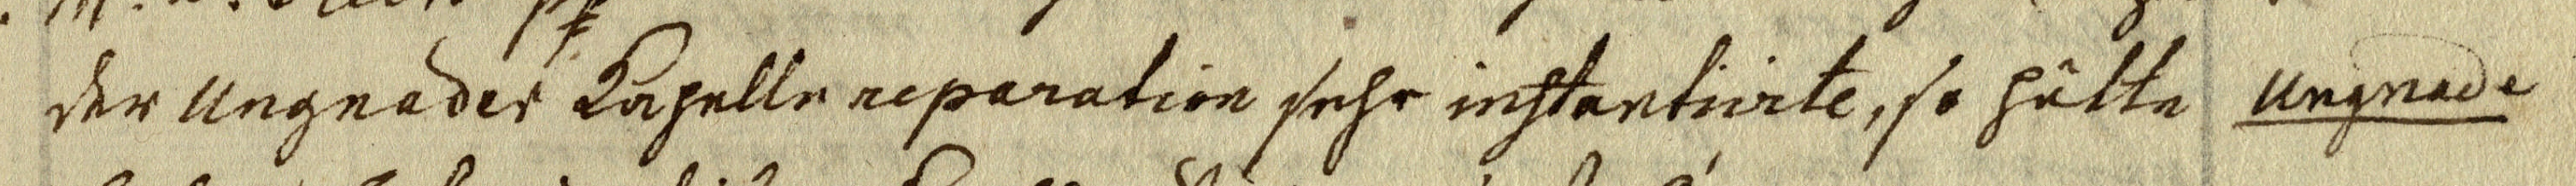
der Ungnader Kapelle reparation sehr instantiirte, so hätte Ungnade
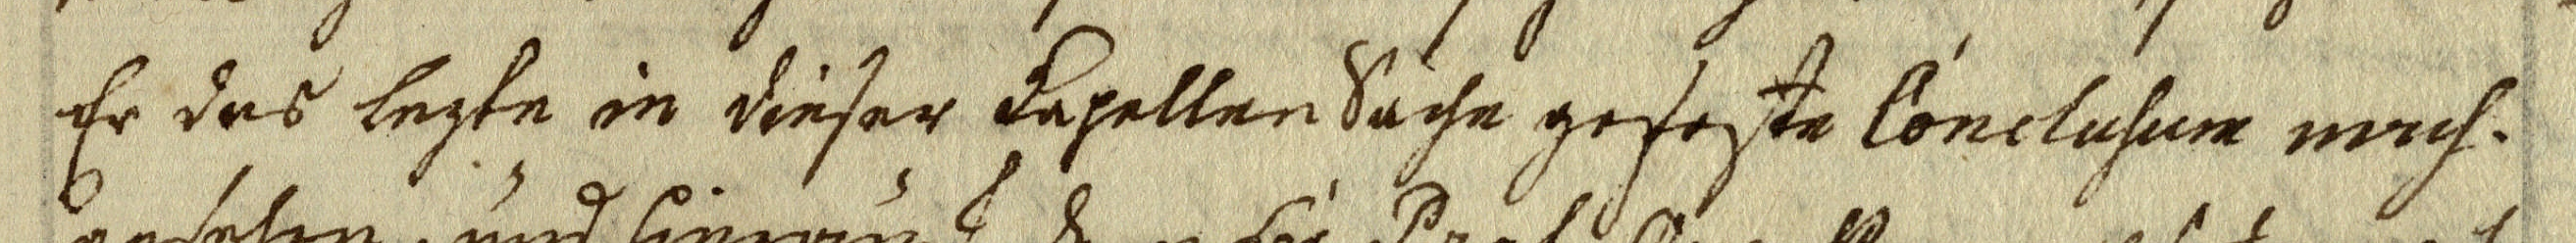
Er das lezte in dieser Kapellen Sache gefaste Conclusum nach¬
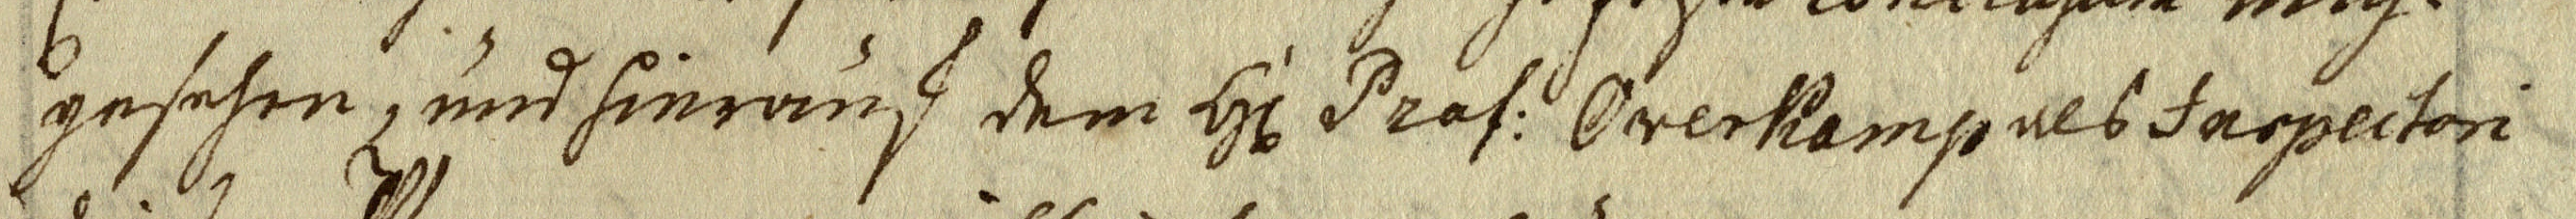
gesehen, und hierauf dem H Prof. Overkamp als Inspectori
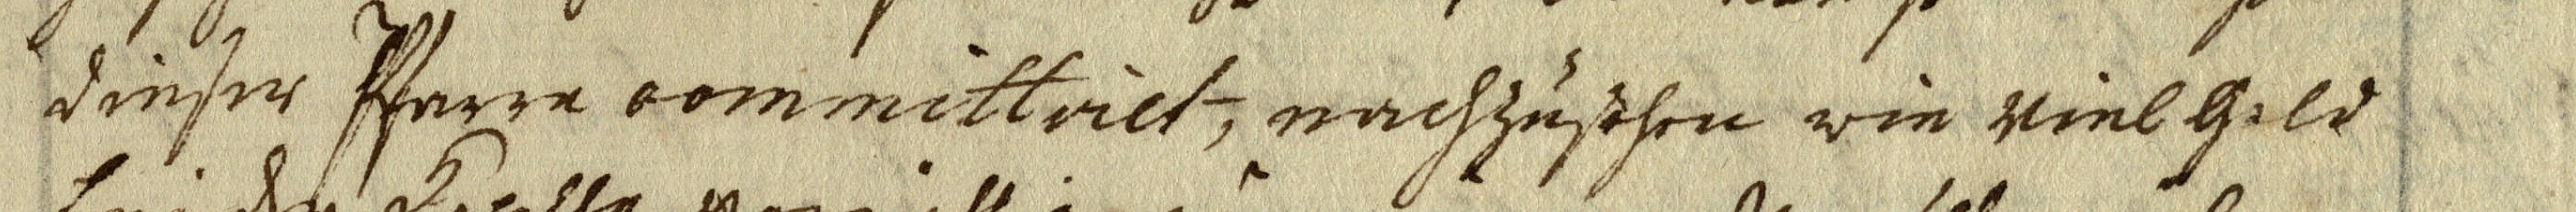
dieser Pfarre commitiret, nachzusehen wie viel Geld
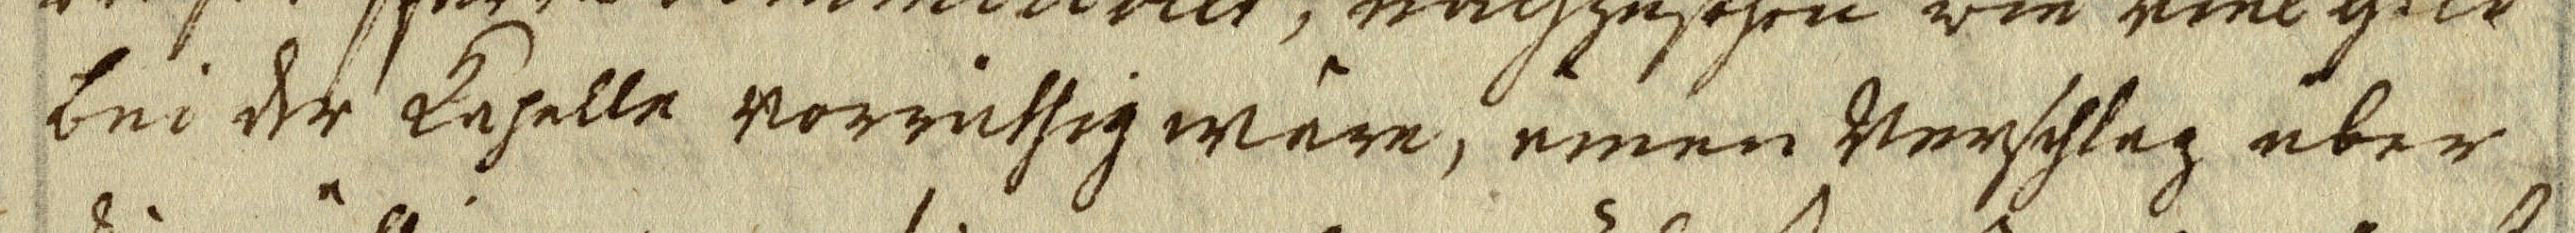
bei der Kapelle vorräthig wäre, einen Vorschlag über
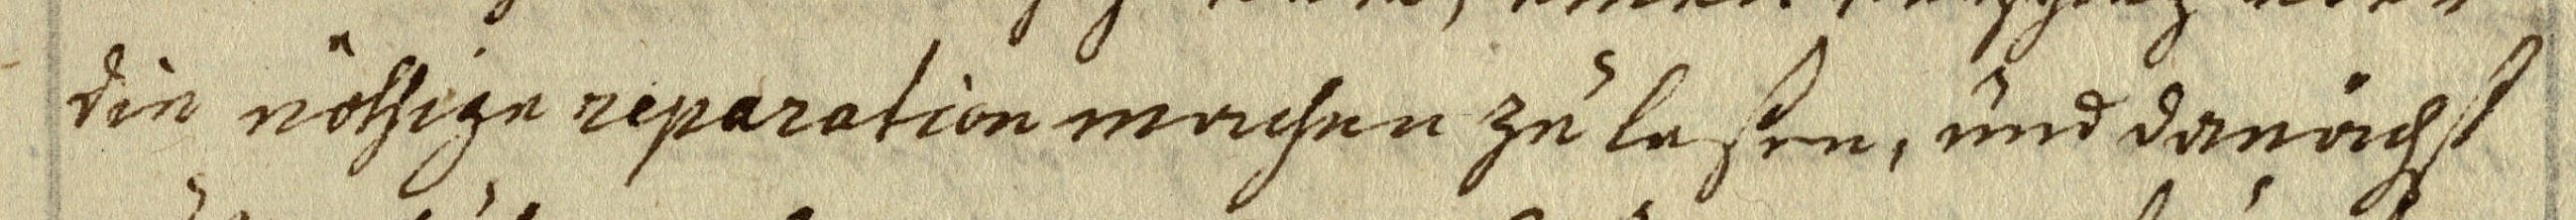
die nöthige reparation machen zu laßen, und danächst
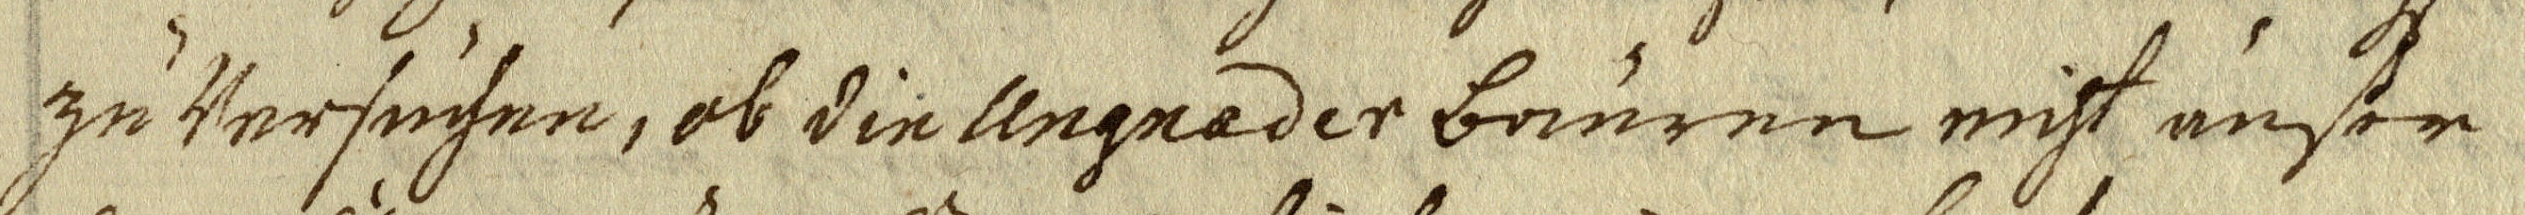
zu versuchen, ob die Ungnader Bauren nicht außer
